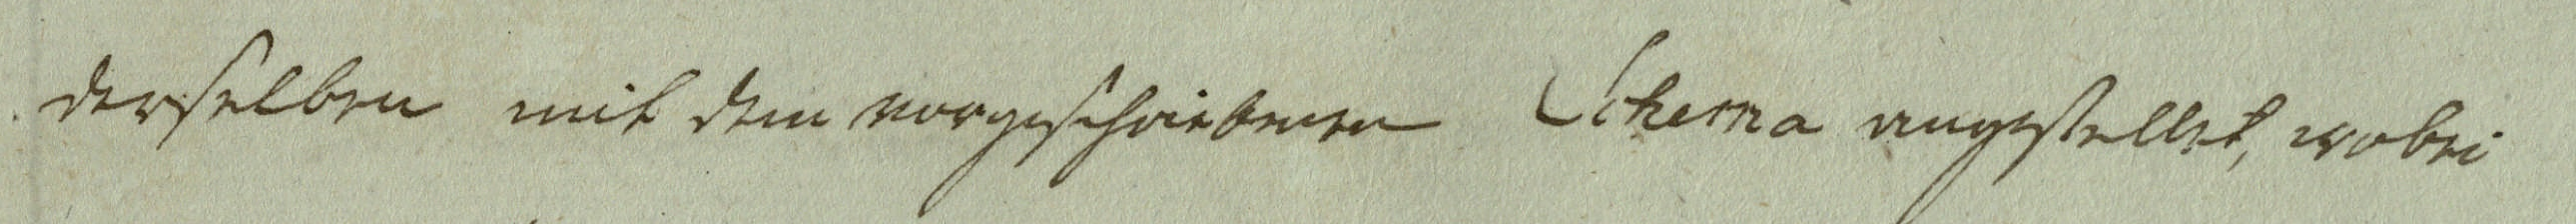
derselben mit dem vorgeschriebenen Schema angestellet, wobei
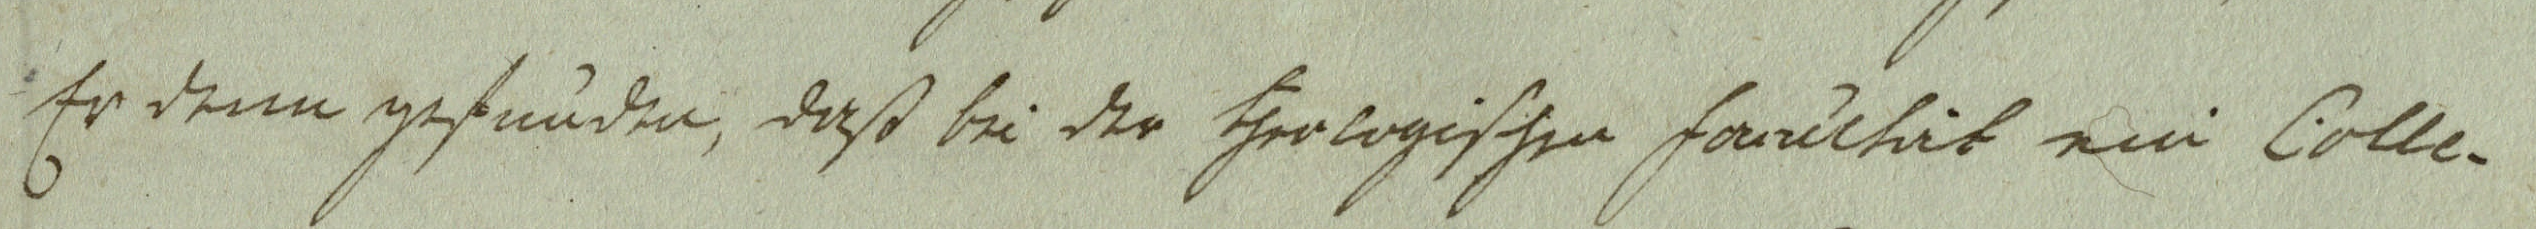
Er denn gefunden, daß bei der Theologischen Facultät ein Colle¬
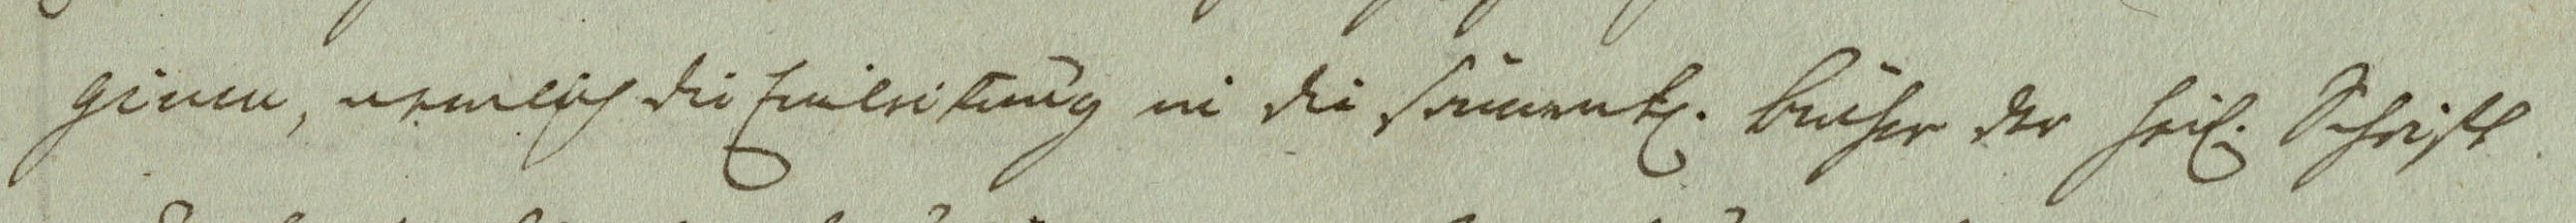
gium, nemlich die Einleitung in die sämmtl. Bücher der heil. Schrift
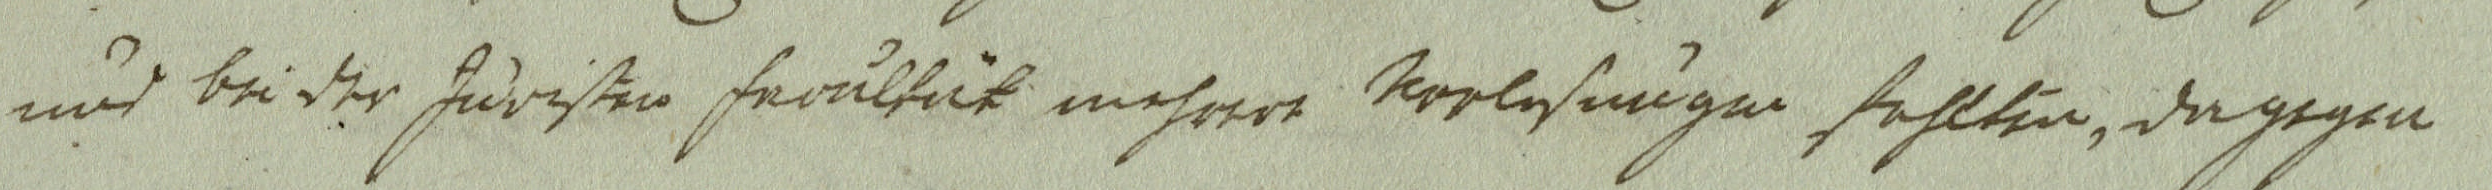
und bei der Juristen Facultät mehrere Vorlesungen fehlten, dagegen
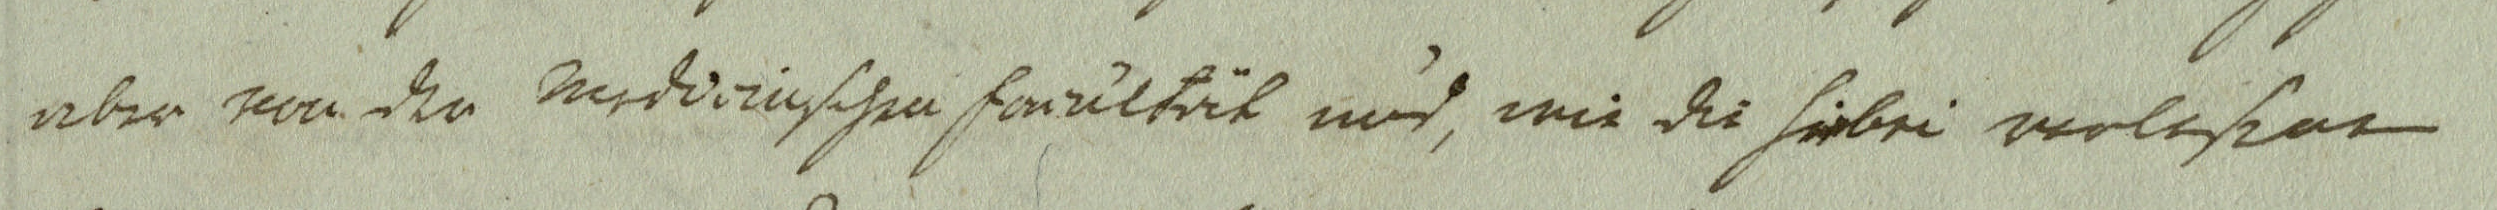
aber von der Medicinischen Facultät und, wie die hiebei verlesene
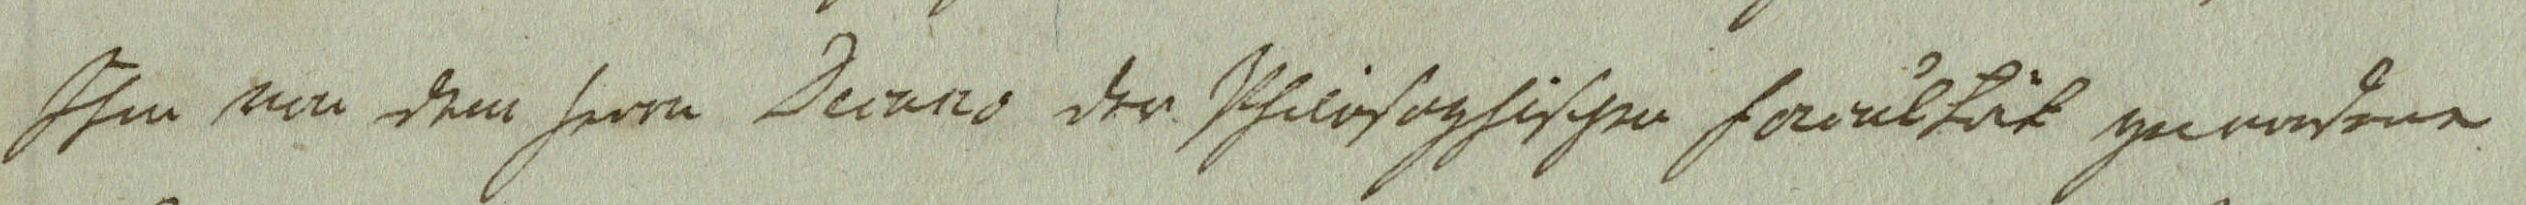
Ihm von dem herrn Decano der Philosophischen Facultät gewordene
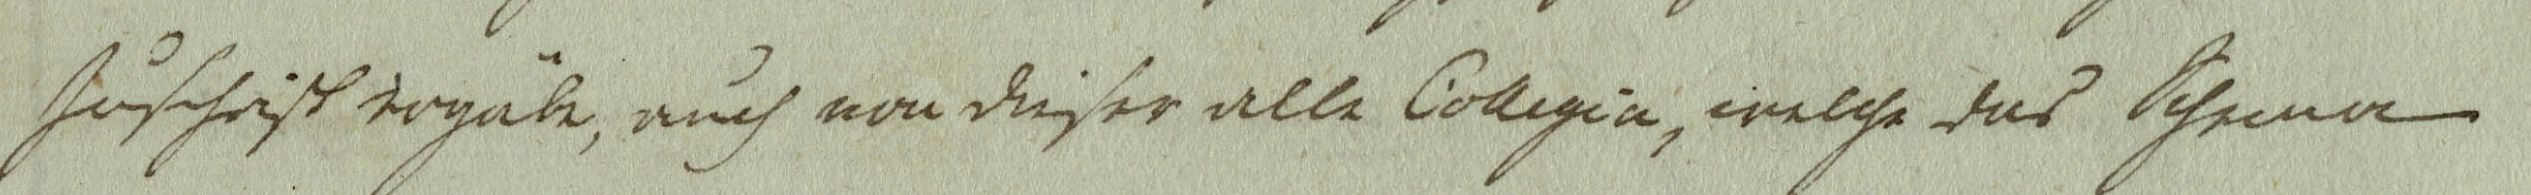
Zuschrift ergäbe, auch von dieser alle Collegia, welche das Schema
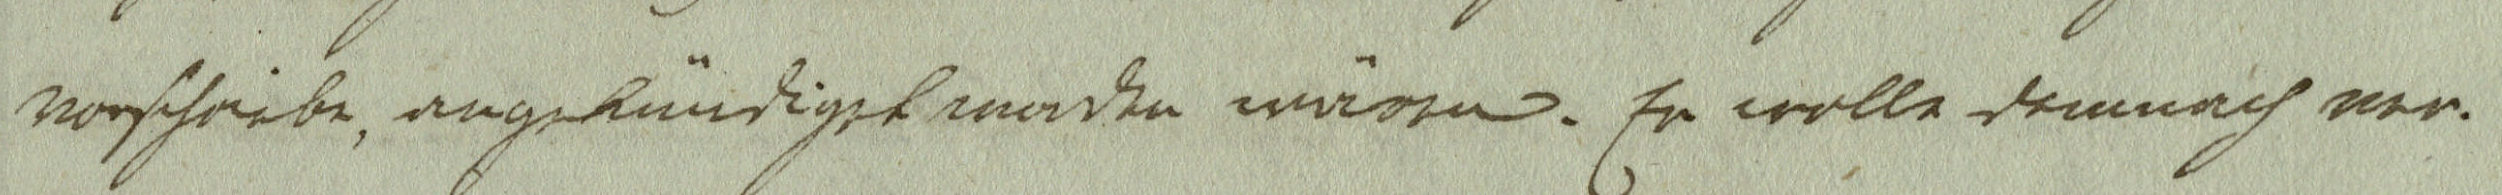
vorschriebe, angekündiget worden wären. Er wolle demnach ver¬
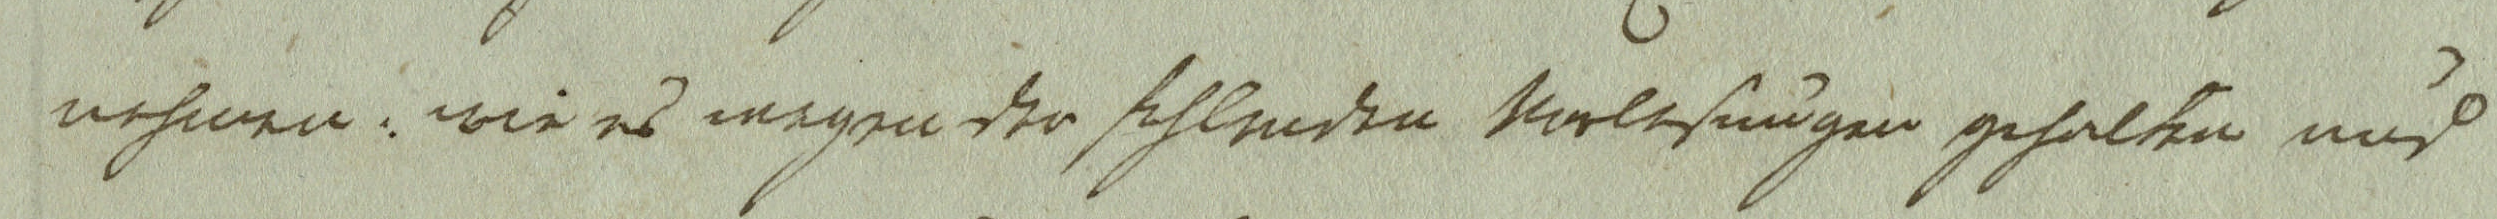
nehmen: wie es wegen der fehlenden Vorlesungen gehalten und
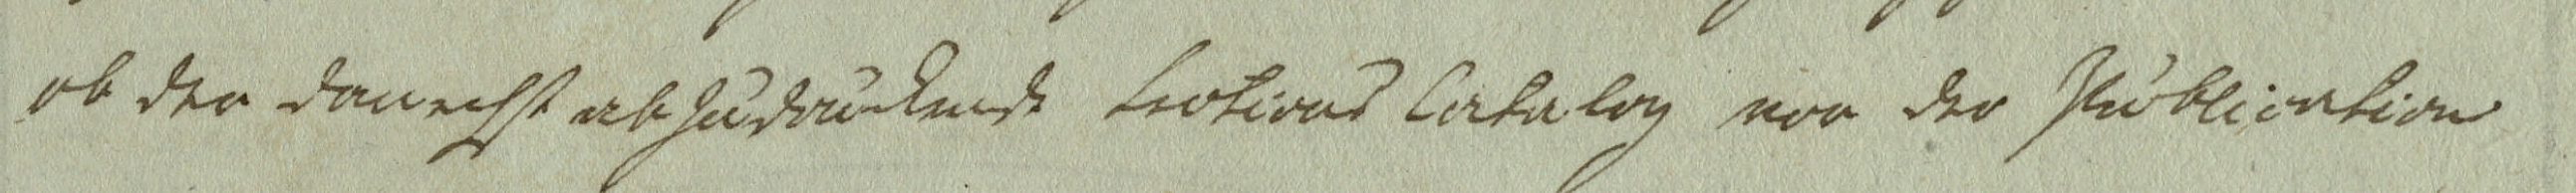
ob der danechst abzudruckende Lections Catalog vor der Publication
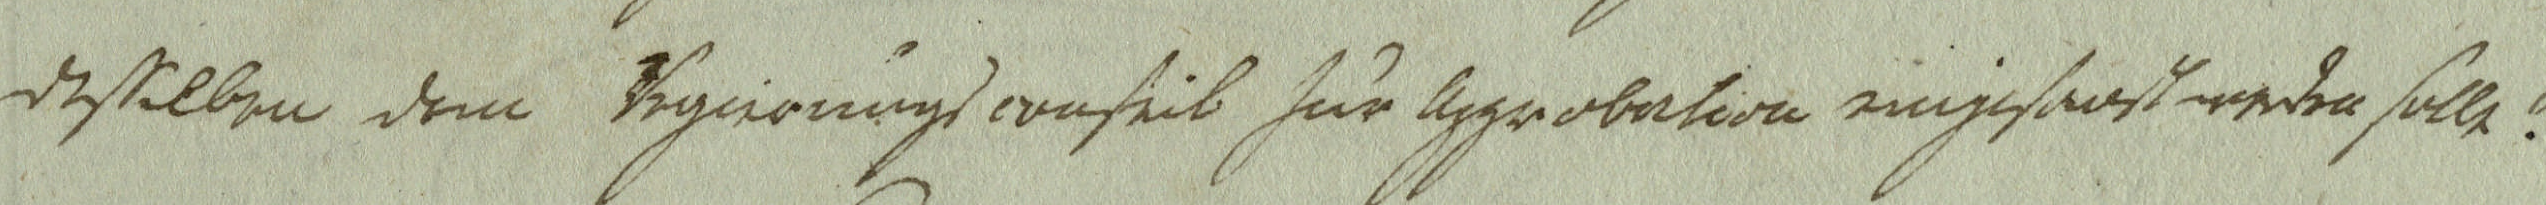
desselben dem Regierungs conseil zur Approbation eingesandt werden solle?
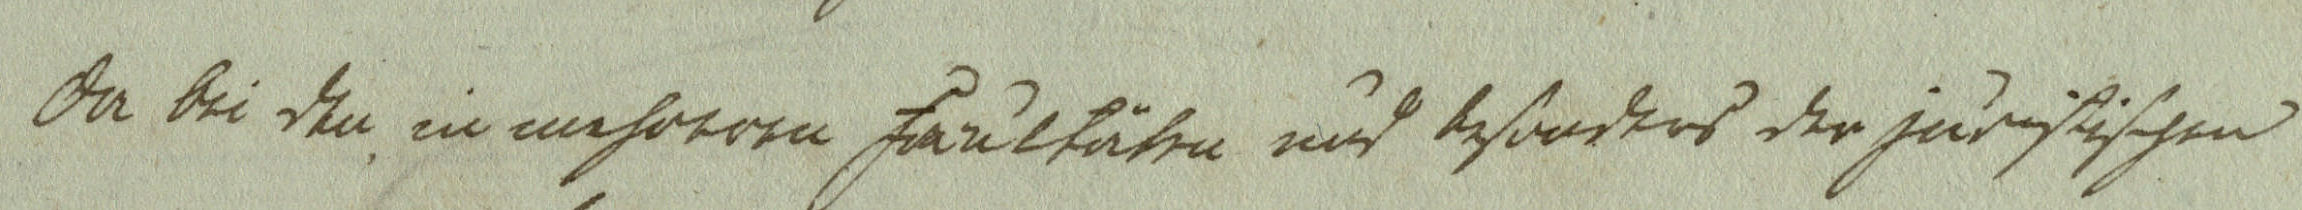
Da bei den in mehreren Facultäten und besonders der juristischen
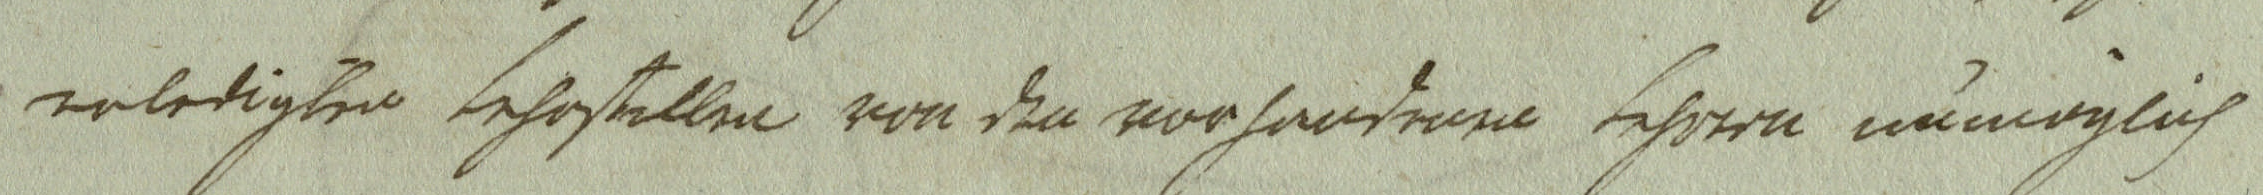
erledigten Lehrstellen von den vorhandenen Lehrern unmöglich
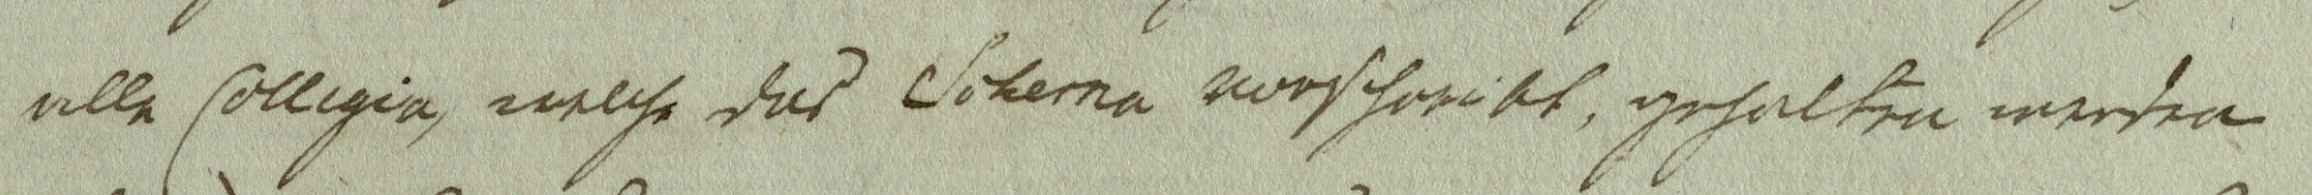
alle Collegia, welche das Schema vorschreibt, gehalten werden
